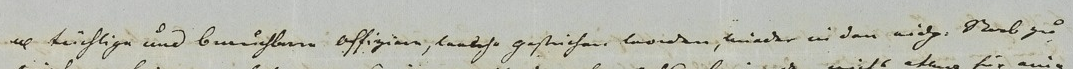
u tüchtige und brauchbare Offiziere, welche gestrichen worden; wieder in den eidg. Stab zu
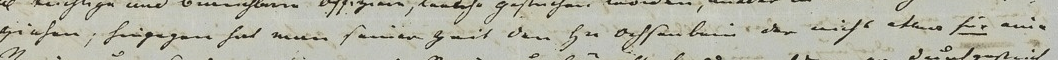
ziehen; hingegen hat man seiner Zeit den Hrn Ochsenbein der nicht etwa für eine
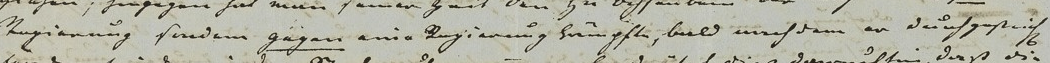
Regierung sondern gegen eine Regierung kämpfte, bald nachdem er durchgestrichen
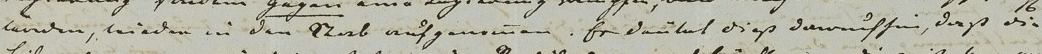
worden, wieder in den Stab aufgenommen. Es deutet dieß daraufhin, daß die
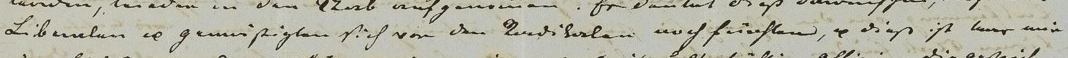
Liberalen u Gemäßigten sich vor den Radikalen noch fürchten, u dieß ist was mir
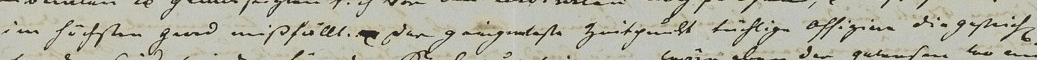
im höchsten Grad mißfällt. Der geeignete Zeitpunkt tüchtige Offiziere die gestrichen
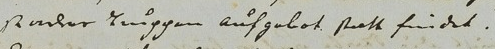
starkes Truppen Aufgebot statt findet.
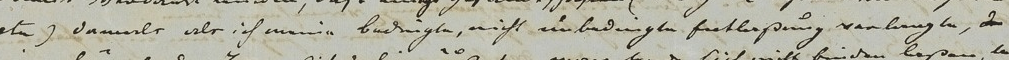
etc.) damals als ich meine bedingte, nicht unbedingte Entlaßung verlangte, es
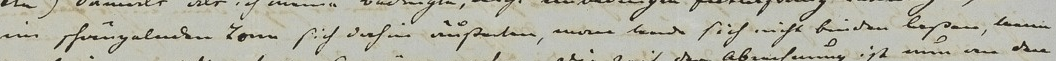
in schänzelnden Tone sich dahin äußerten, man werde sich nicht binden laßen, wenn
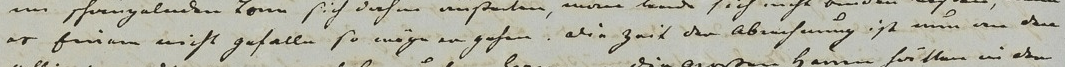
es Einem nicht gefalle so möge er gehen. Die Zeit der Abrechnung ist nun an den
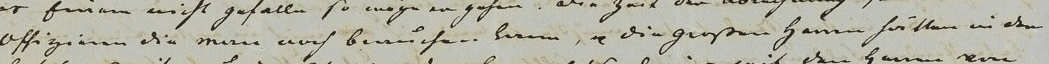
Offizieren die man noch brauchen kann, u die großen Herren hätten in der
